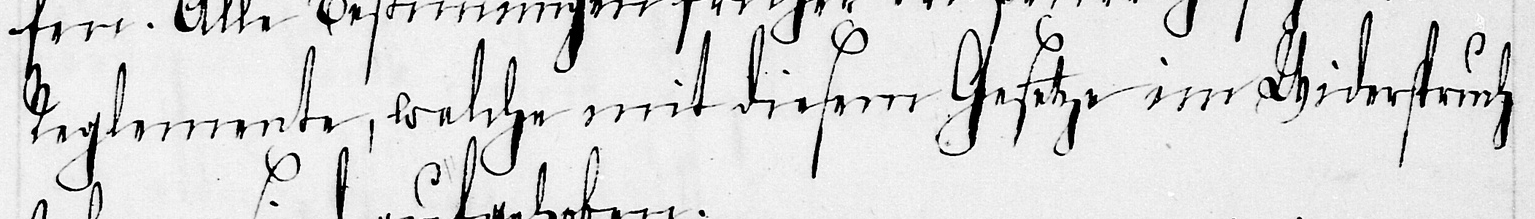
Reglemente, welche mit diesem Gesetze im Widerspruch
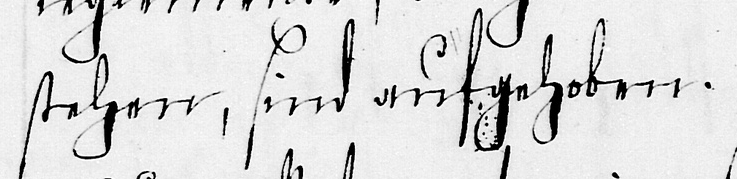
stehen, sind aufgehoben.
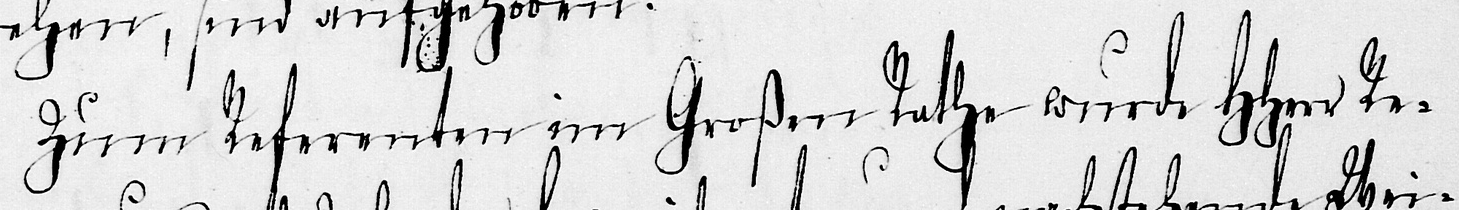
Zum Referenten im Großen Rathe wurde HHerr Re¬
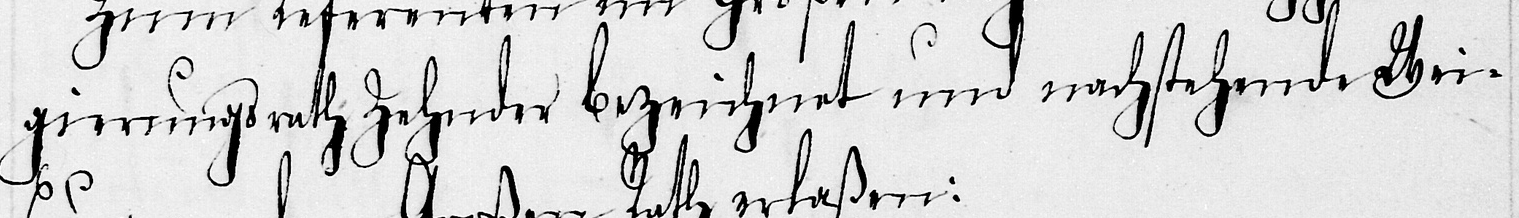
gierungsrath Zehnder bezeichnet und nachstehende Wei¬
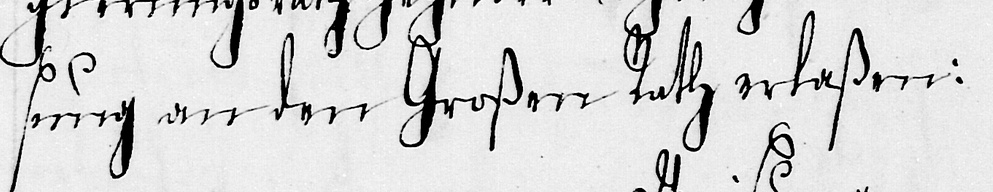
sung an den Großen Rath erlaßen:
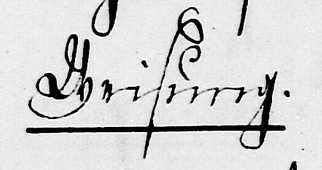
Weisung.
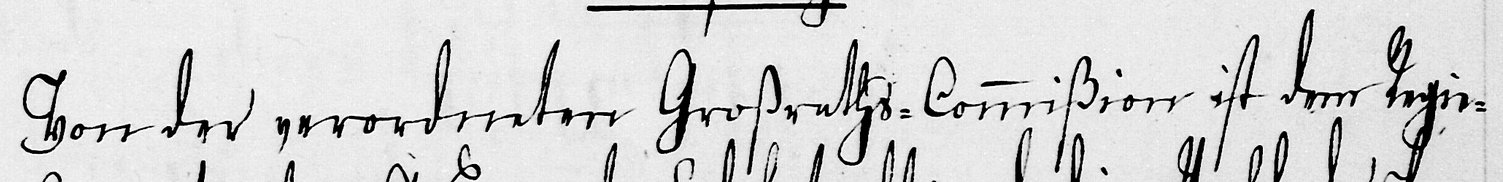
Von der verordneten Großraths-Commißion ist dem Regie¬
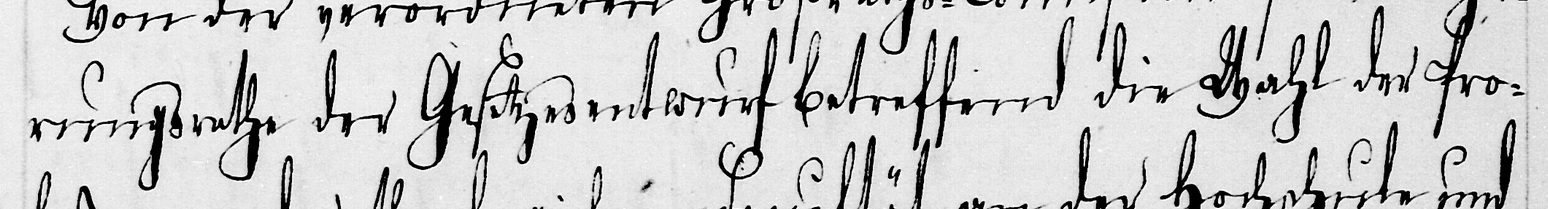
rungsrathe der Gesetzesentwurf betreffend die Wahl der Pro¬
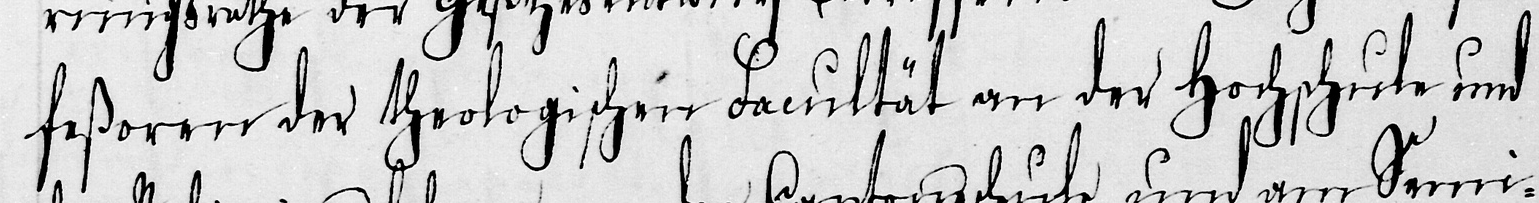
feßoren der theologischen Facultät an der Hochschule und
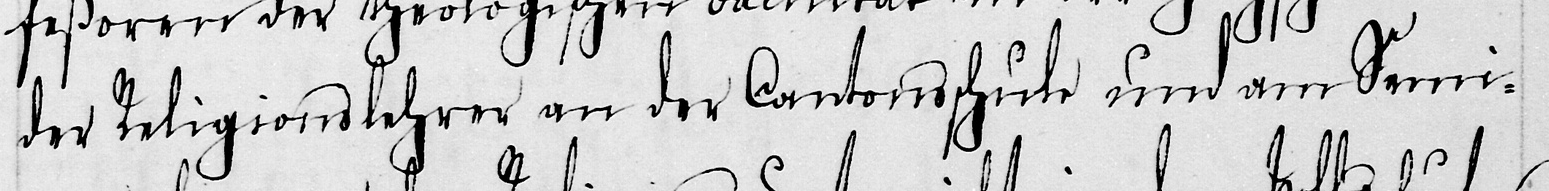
der Religionslehrer an der Cantonsschule und am Semi¬
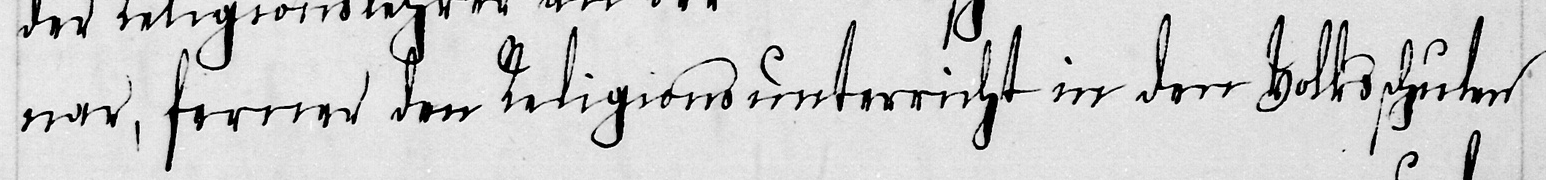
nar, ferner den Religionsunterricht in den Volksschulen
